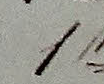1
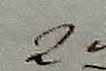2
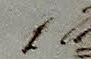1
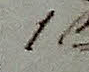1
